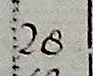28
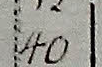40
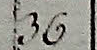36
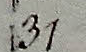31
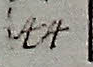44
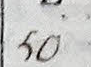50
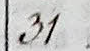31
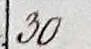30
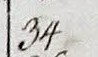34
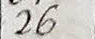26
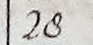28
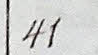41
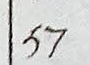57
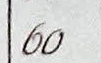60
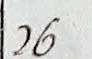26
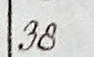38
